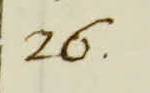26.
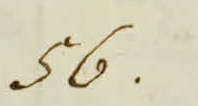56.
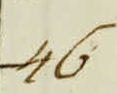46
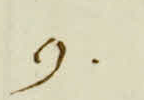9.
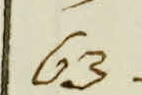63
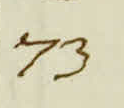73
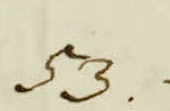53.
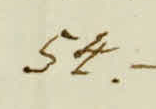54
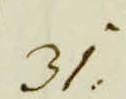31.
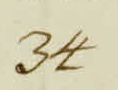34
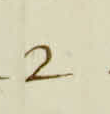2
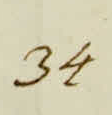34
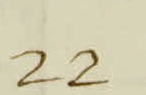22
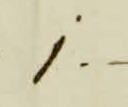1.
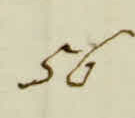56
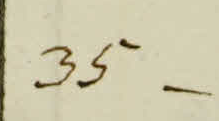35
